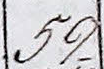59
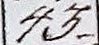43
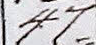47
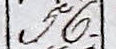56
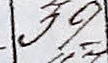39
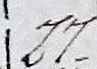27
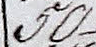50
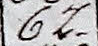62
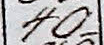40
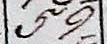59
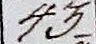43
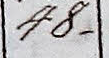48
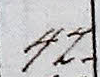42
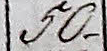50
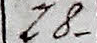28
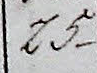25
